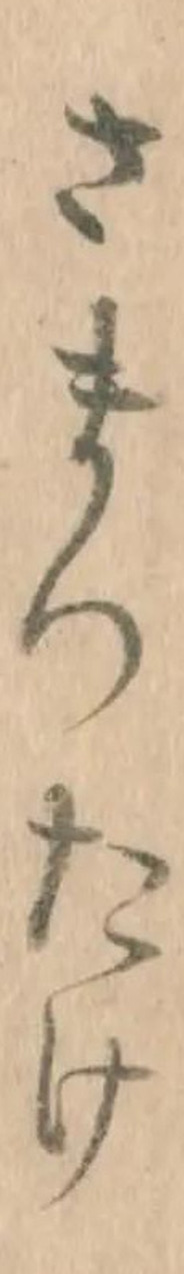さまつたけ
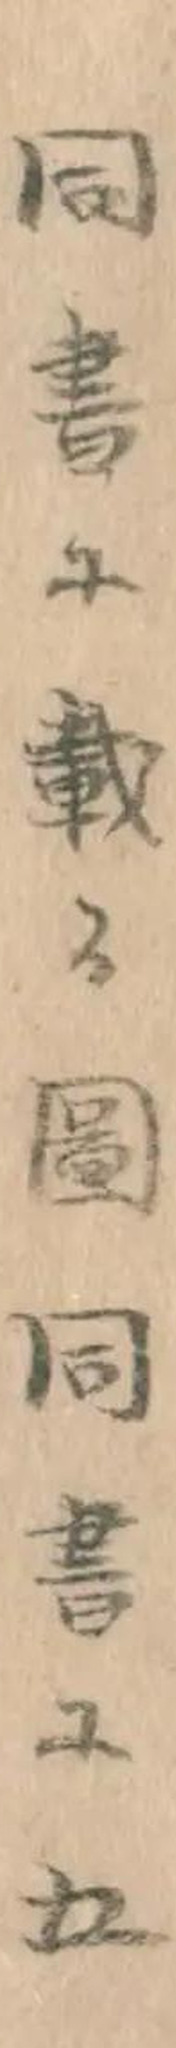同書に載る図同書に五
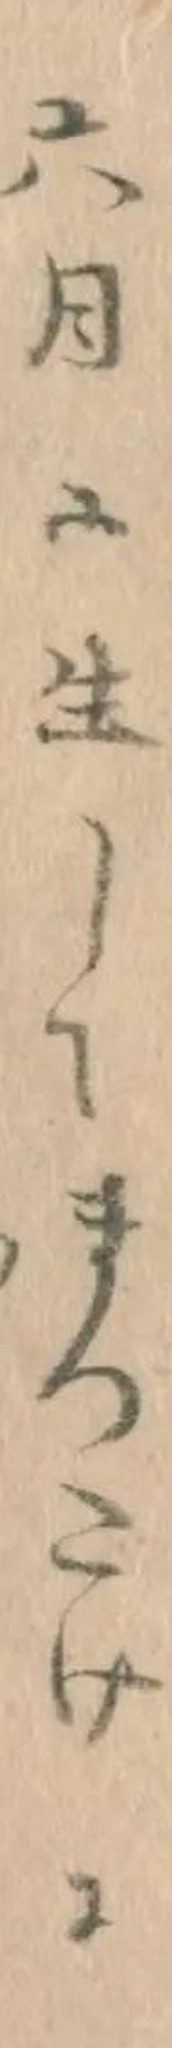六月に生してまつたけに
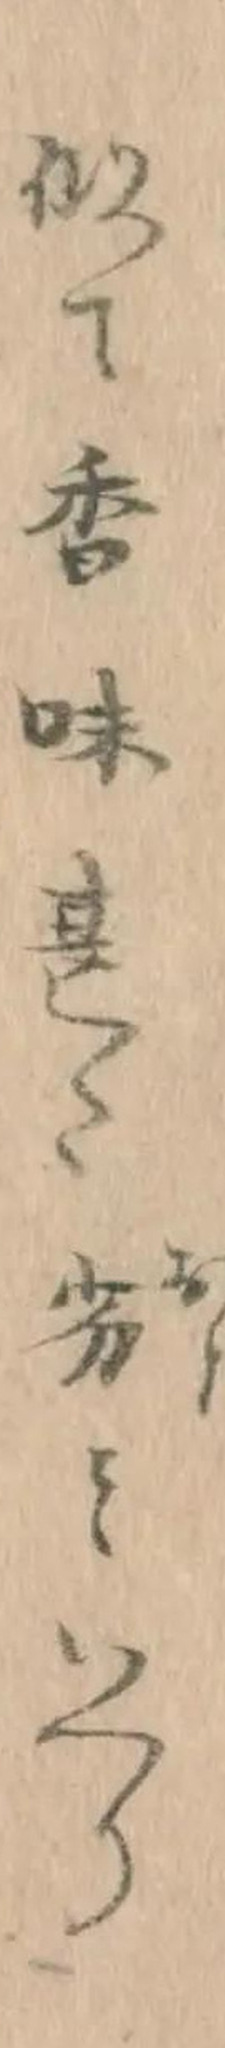似て香味甚た劣といへり
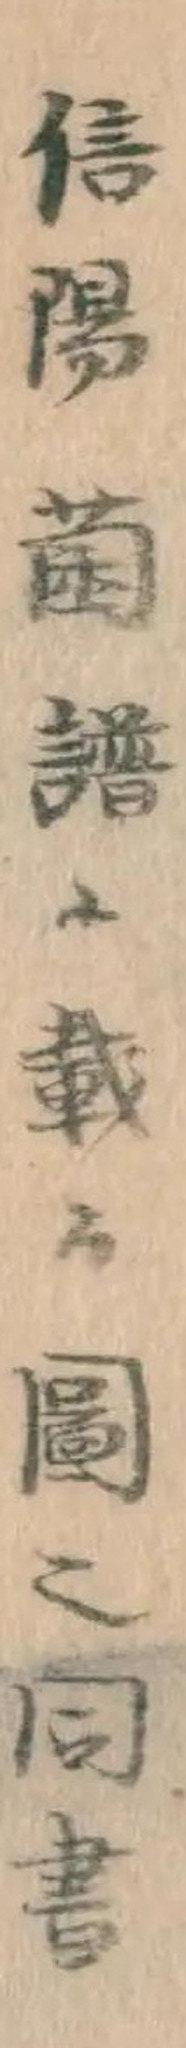信陽菌譜に載る図也同書
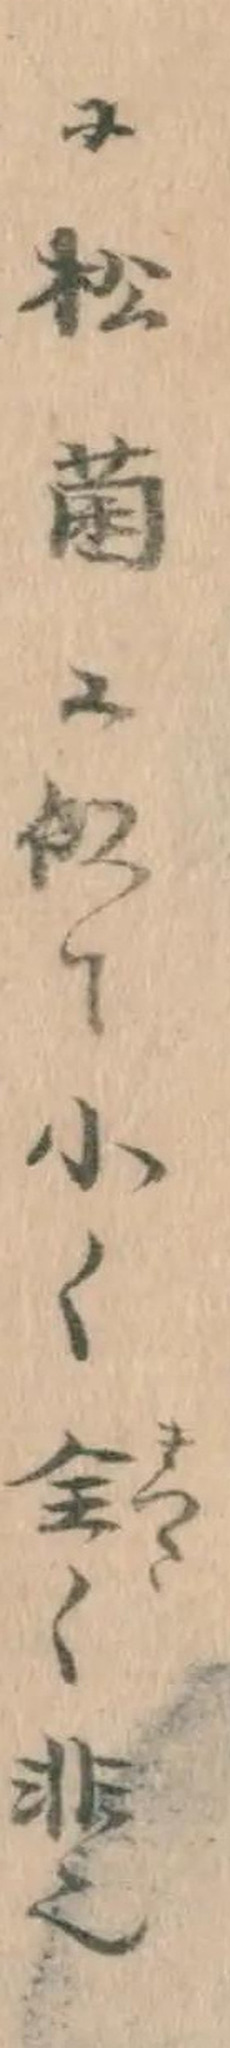に松菌に似て小く全く非也
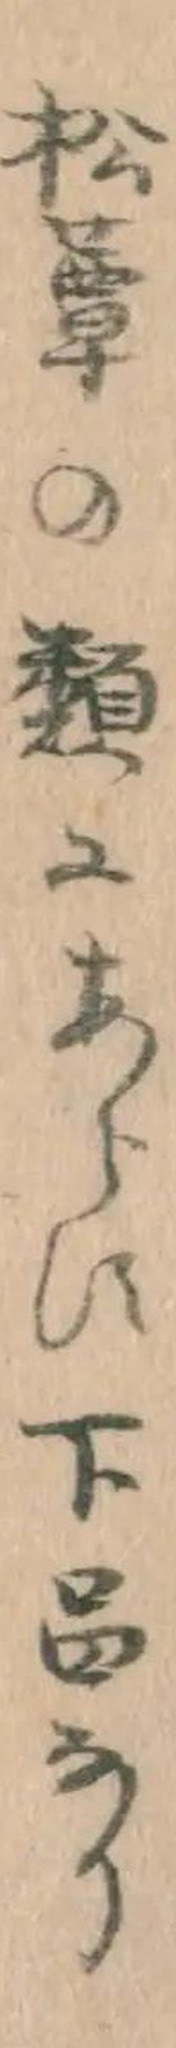松蕈の類にあらす下品なり
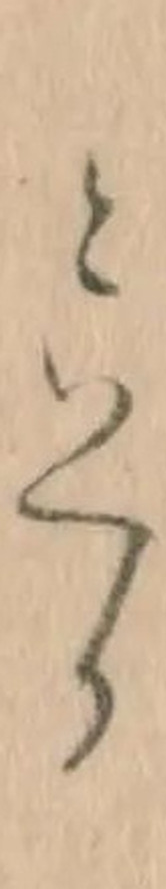といへり
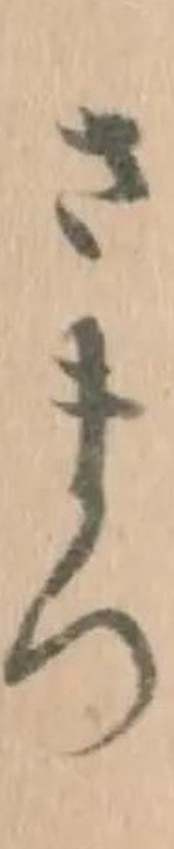はまつ

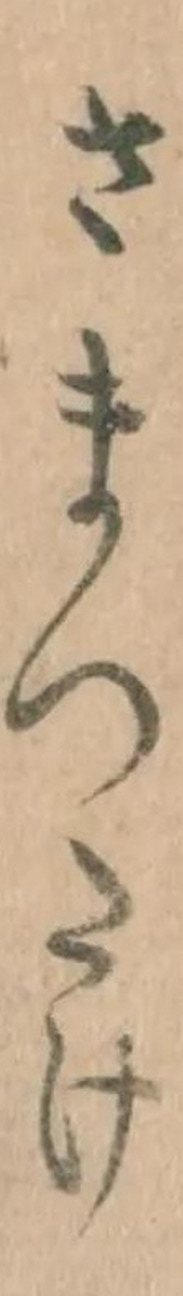さまつたけ
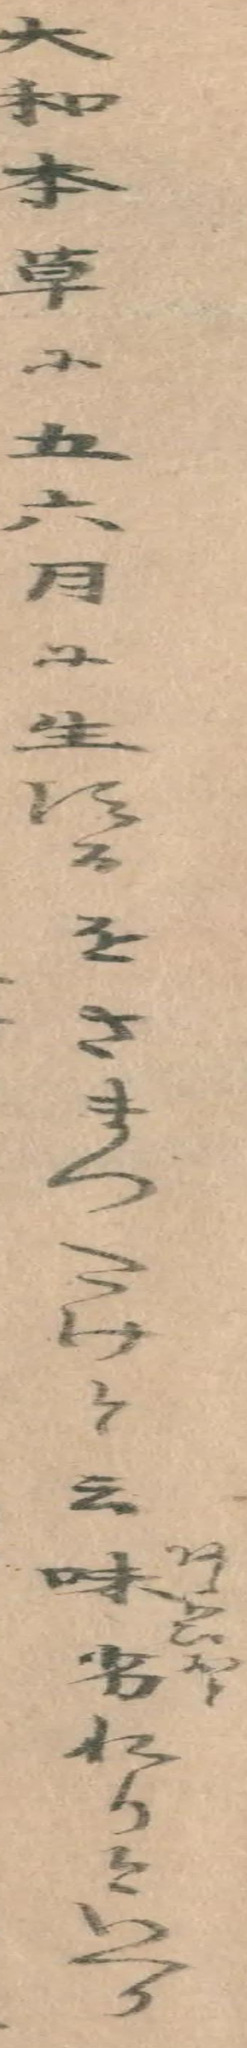大和本草に五六月に生するをさまつたけと云味劣れりといへり
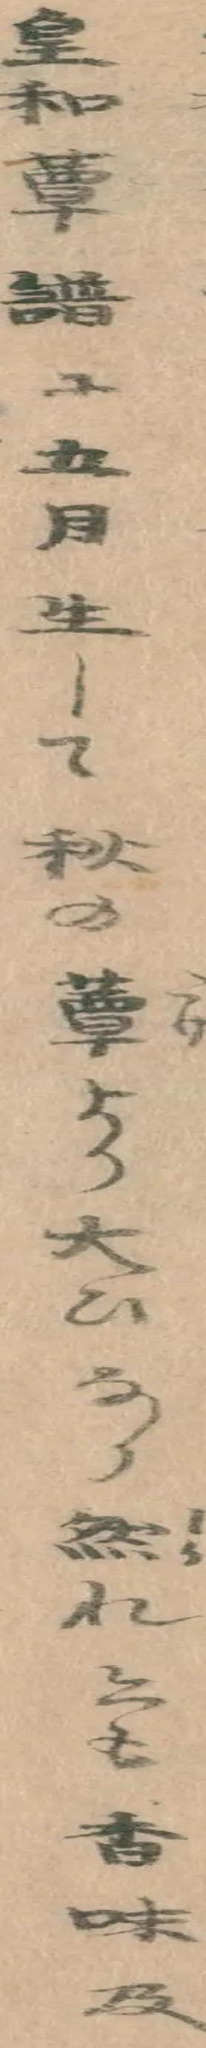皇和蕈譜に五月生して秋の蕈より大ひなり然れとも香味及
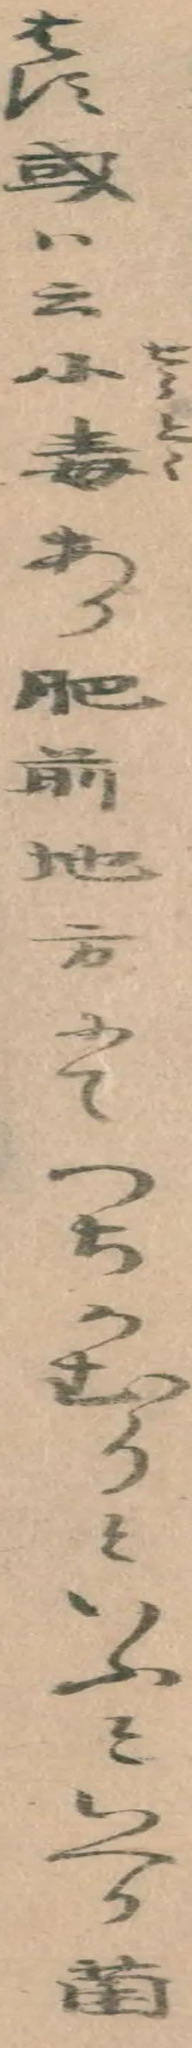はす或は云小毒あり肥前地方にてつちかむりといふといへり菌
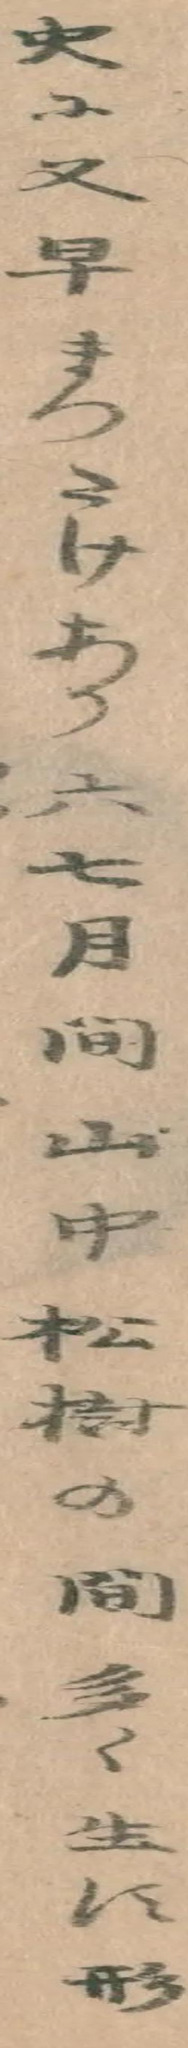史に又早まつたけあり六七月間山中松樹の間多く生す形
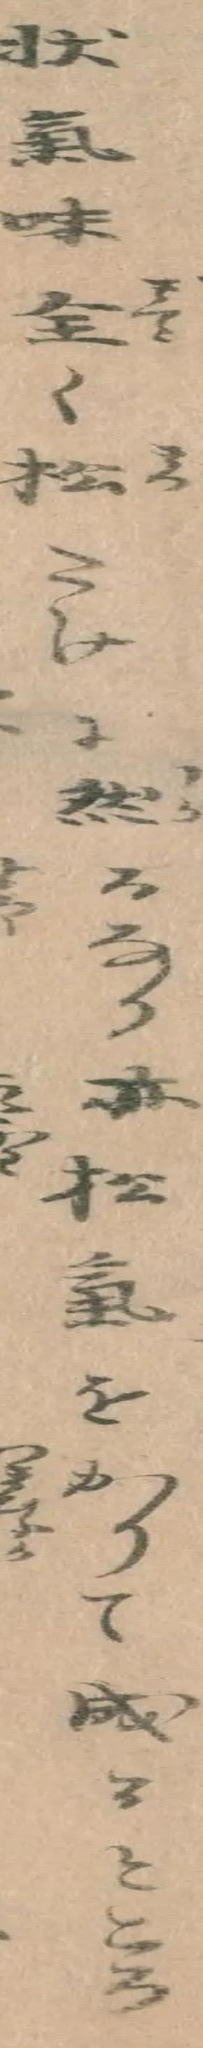状気味全く松たけに然るなり亦松気をかりて成るところ
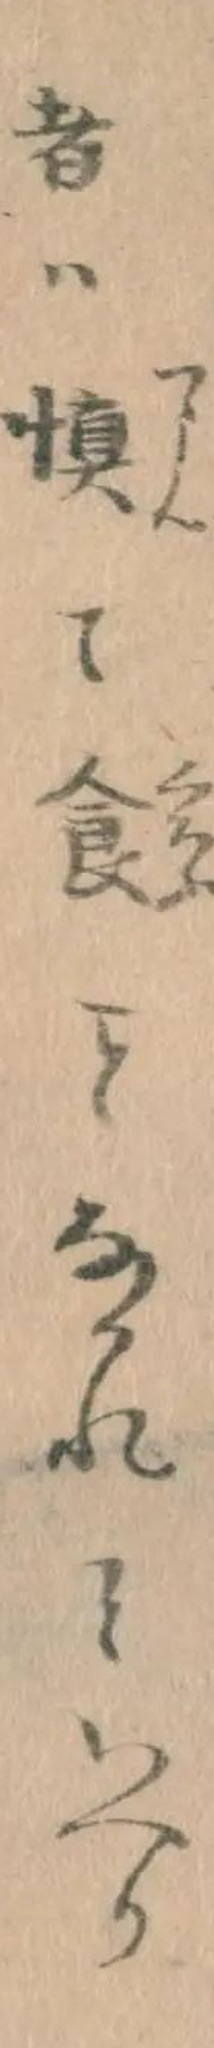者は慎て食ことなかれといへり
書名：本草図譜. 巻55-57
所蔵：国立国会図書館 National Diet Library, JAPAN
